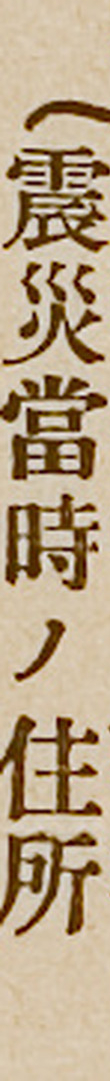震災当時ノ住所
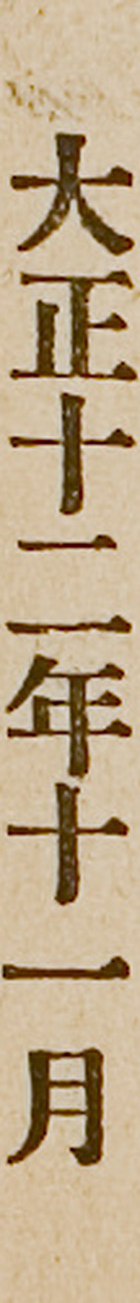大正十二年十一月
